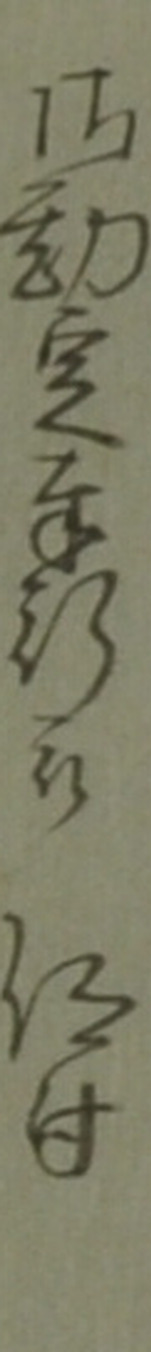御勘定奉行被仰付
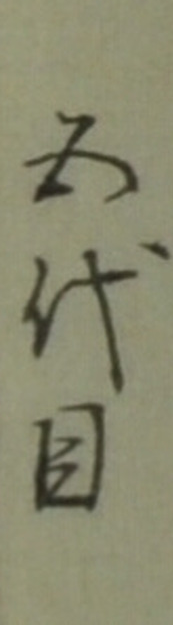五代目

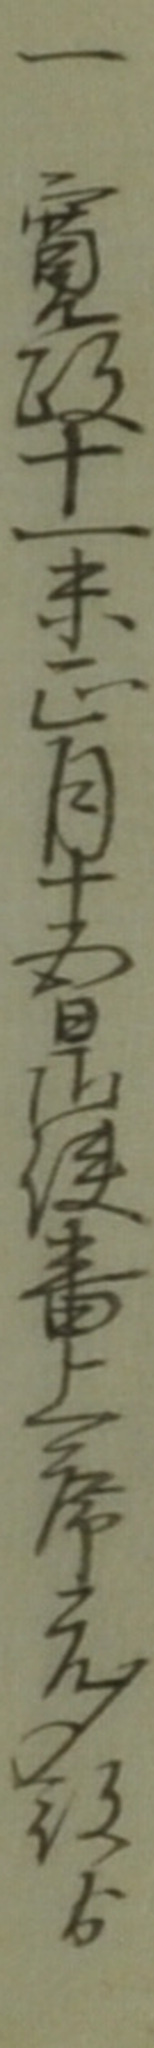一寛政十一未正月十五日御使番上席元〆役ゟ
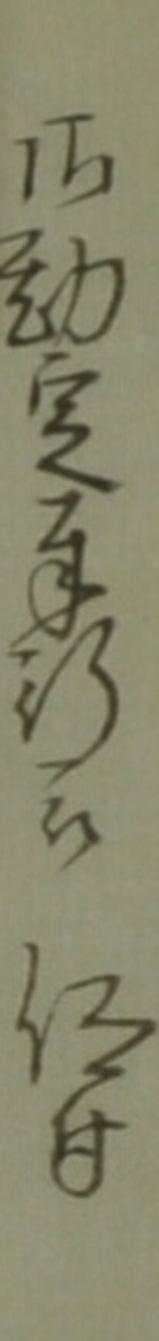御勘定奉行被仰付
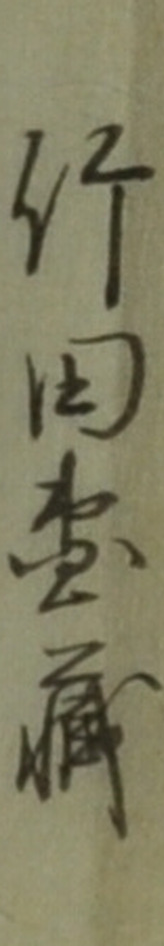竹田金蔵
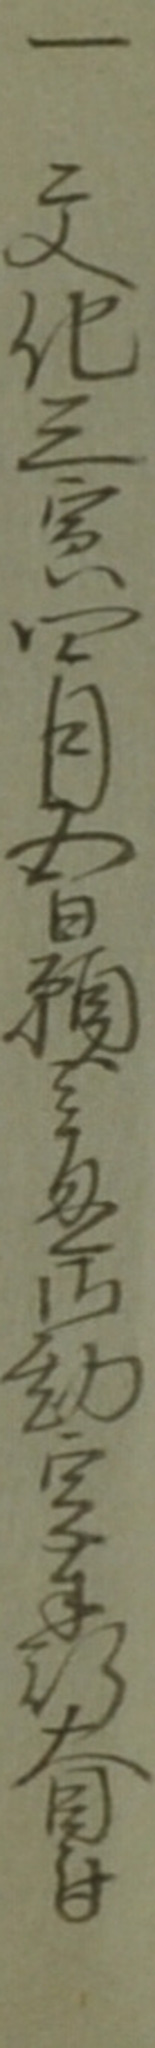一文化三寅四月五日願之通御勘定奉行大目付
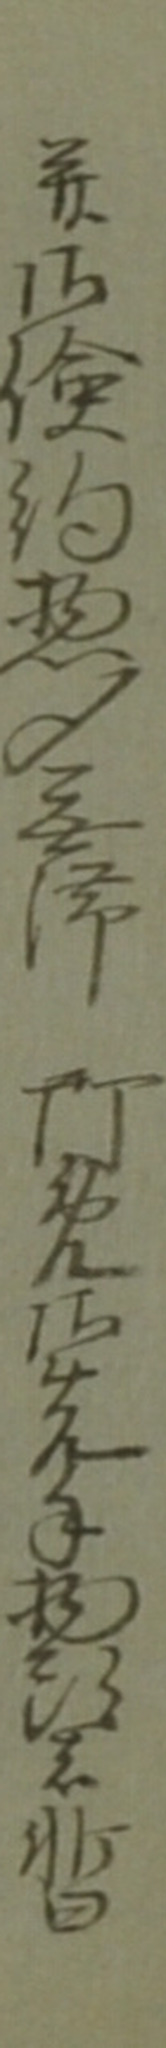并御倹約惣〆無滞御免御先手物頭者暫
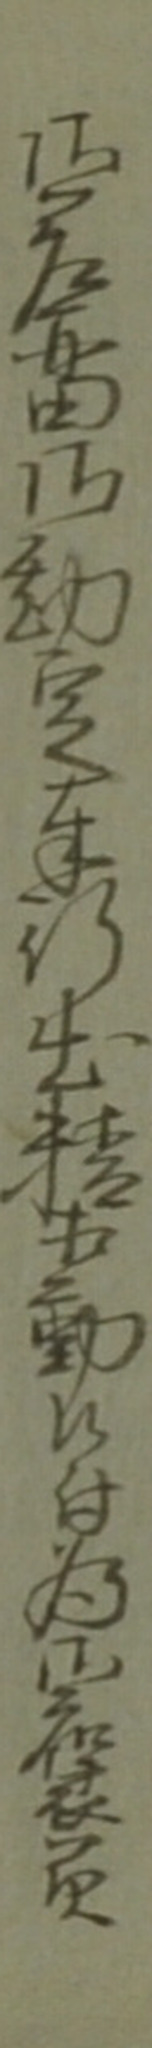御差留御勘定奉行出精相勤候付為御褒美
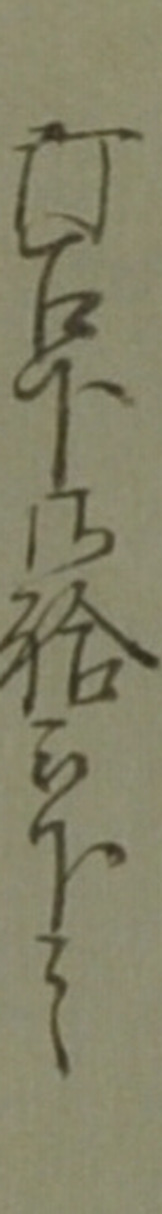御召下御袷被下之
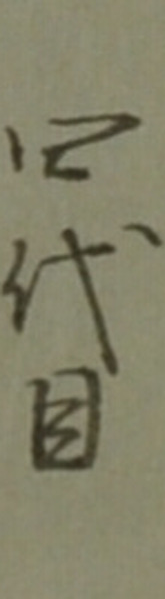四代目
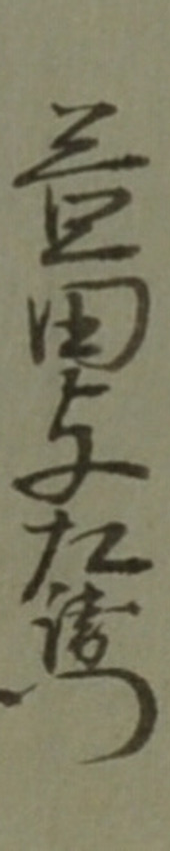益田与左衛門
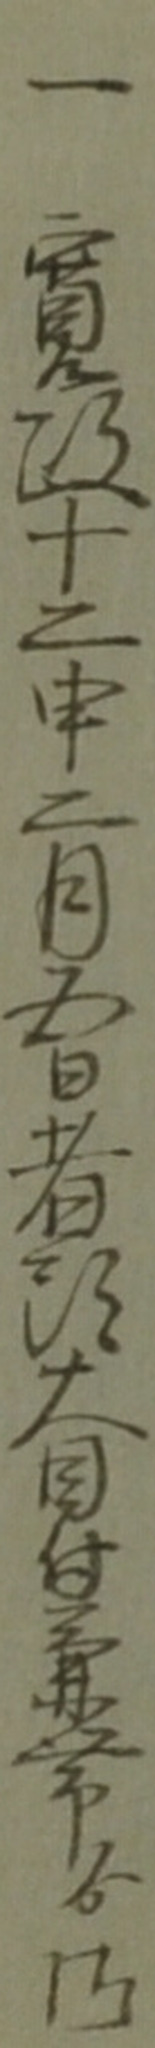一寛政十二申二月五日者頭大目付兼帯ゟ御
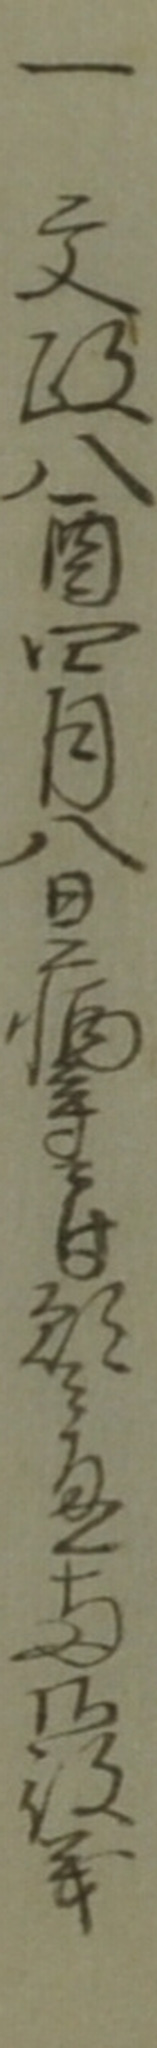一文政八酉四月八日病気ニ付願之通両御役義
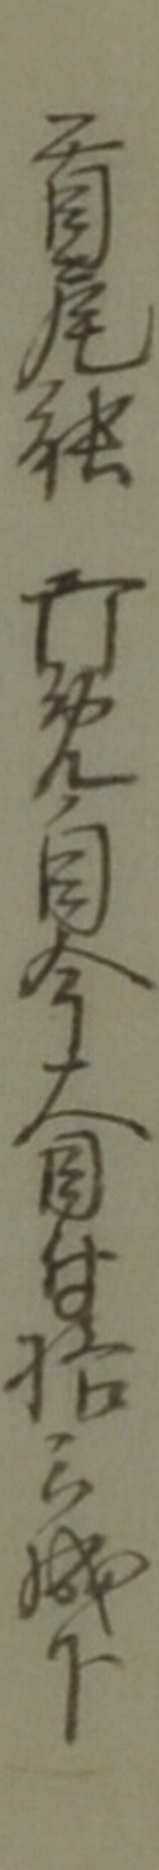首尾能御免自今大目付格被成下
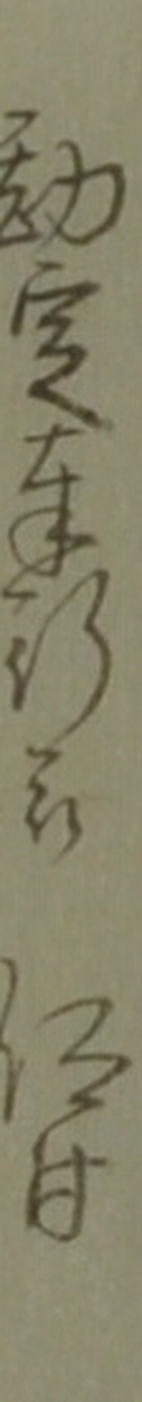勘定奉行被仰付
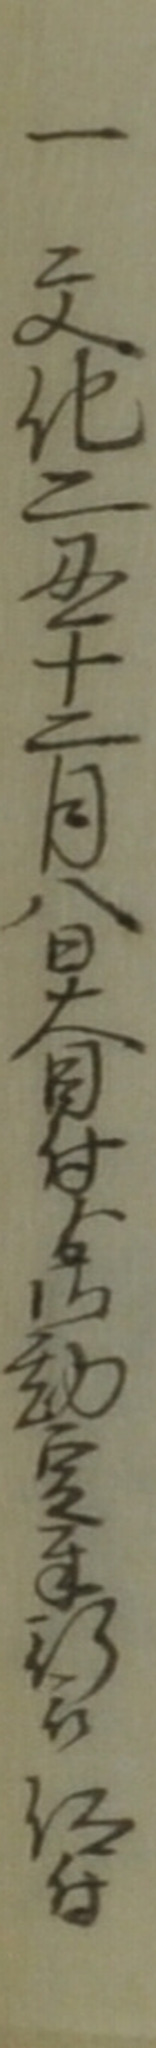一文化二丑十二月八日大目付ゟ御勘定奉行被仰付
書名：諸御役代々録（三）
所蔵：伊那市立高遠町図書館・合同会社AMANE
